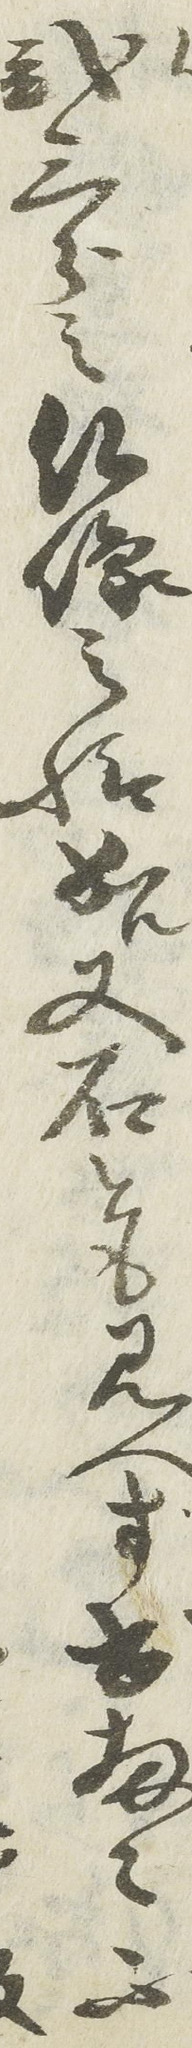弐三分之仏像之様成ル又石とも見へず出扨々不
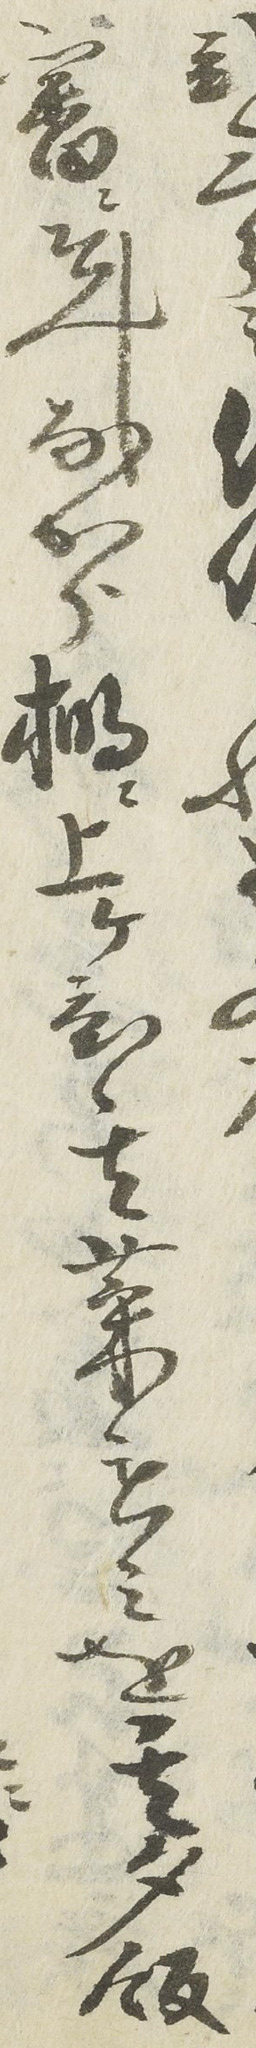審ニそんしなから棚ニ上ケ置候は菜もみを其夕飯
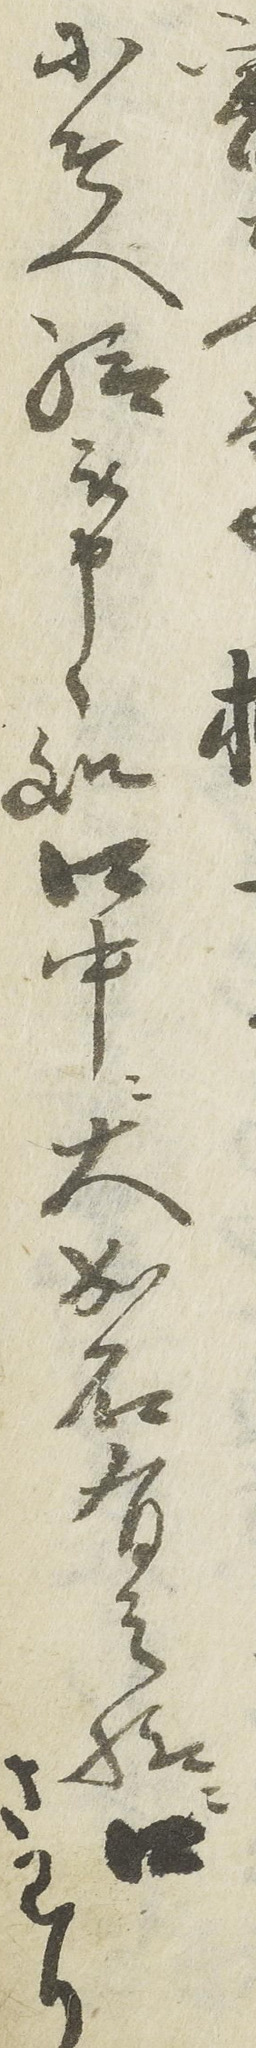にそへ給被申候処口中ニ大成石有之様ニ口さわり

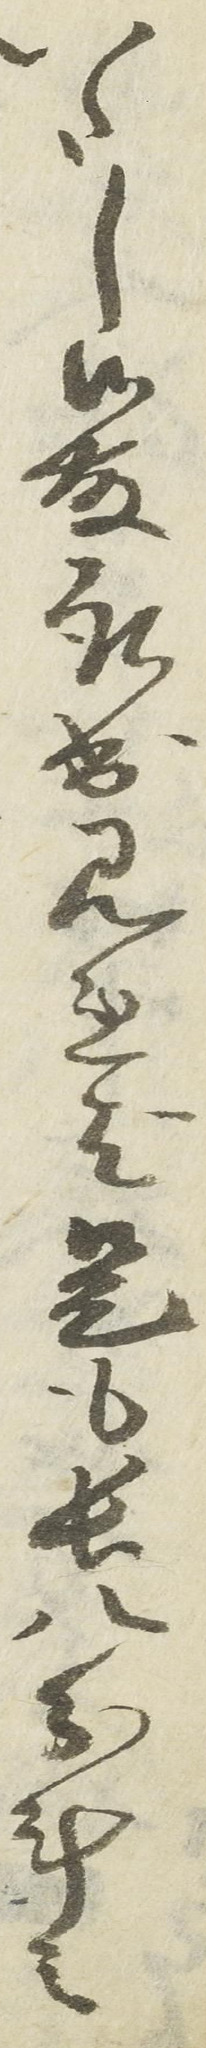いたし候故取出見れば是も長八分計之
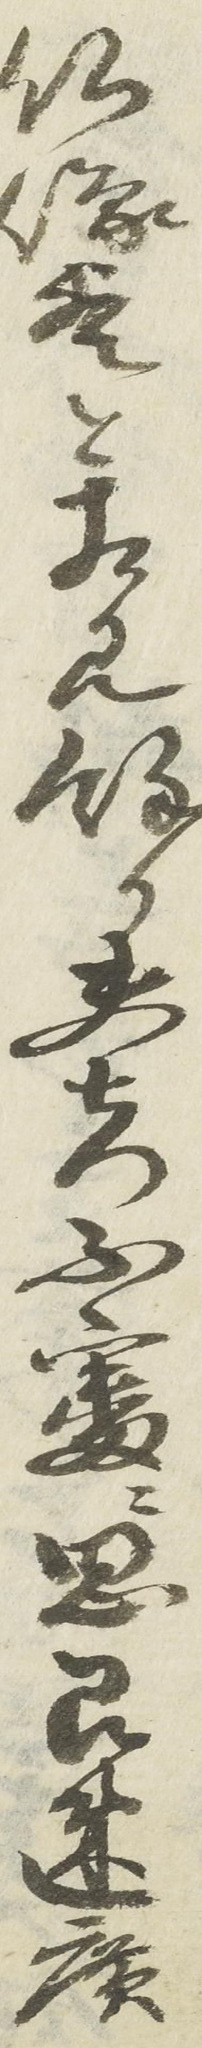仏像歟と相見餘り夫右衛門不審ニ思即速広
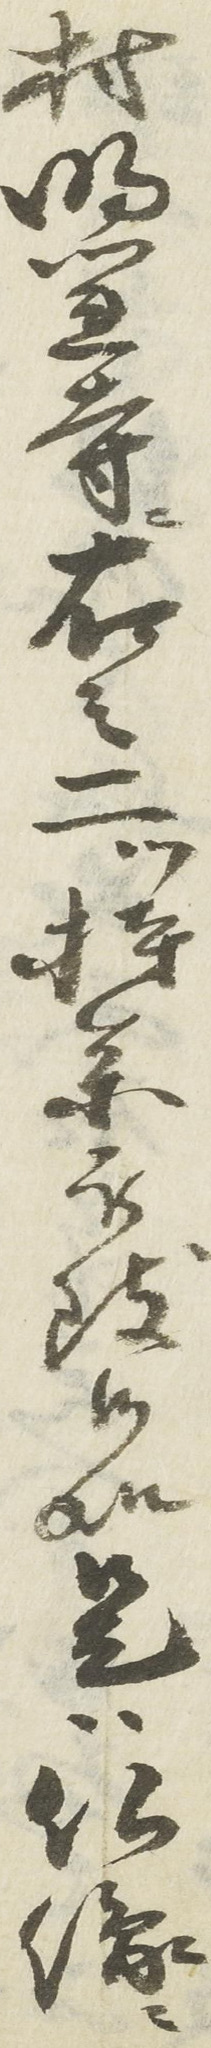村明宣寺ニ右之二ツ持参被致候処是は仏像ニ
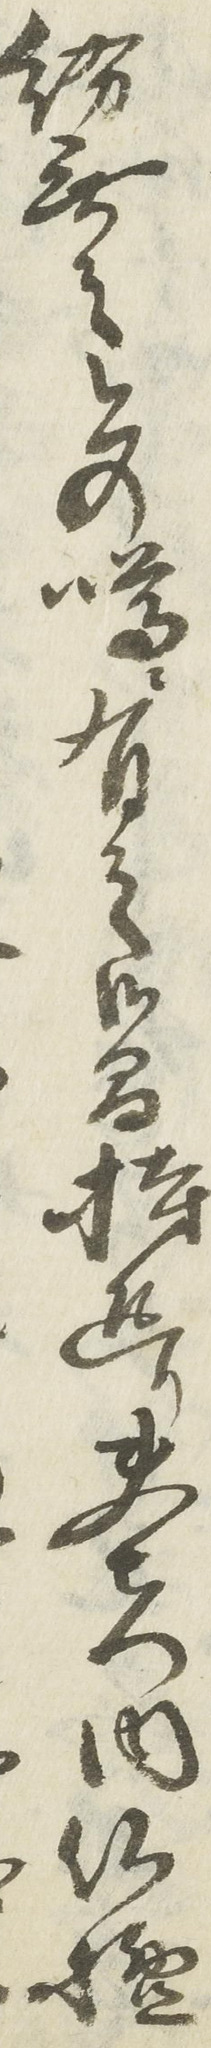紛無之との噂ニ有之候間持返り夫右衛門内仏壇
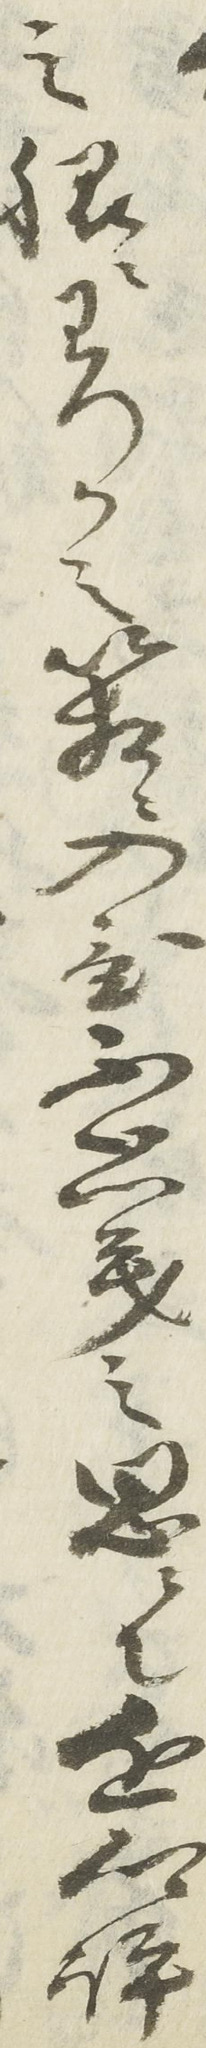之脇ニわつか之箱ニ入置不思義之の思ニて近郷評
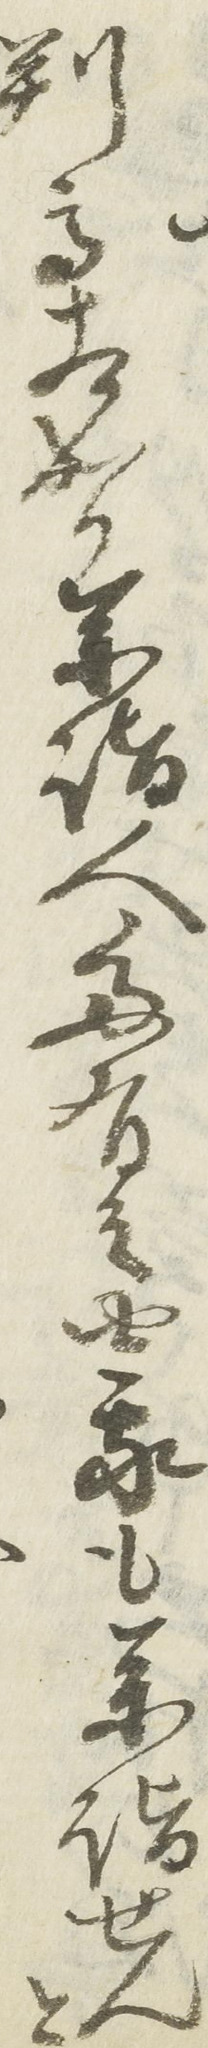判高相成り参詣人多有之由我も参詣せんと
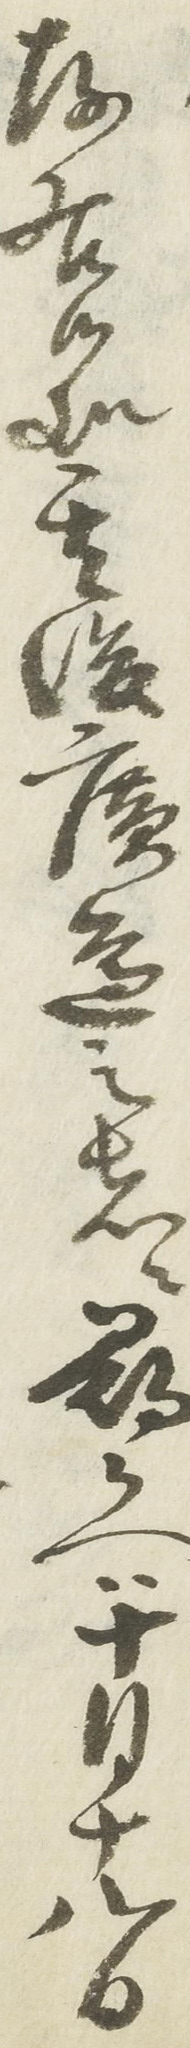存居候処其後広辺之者ニ尋候へは十月十八日
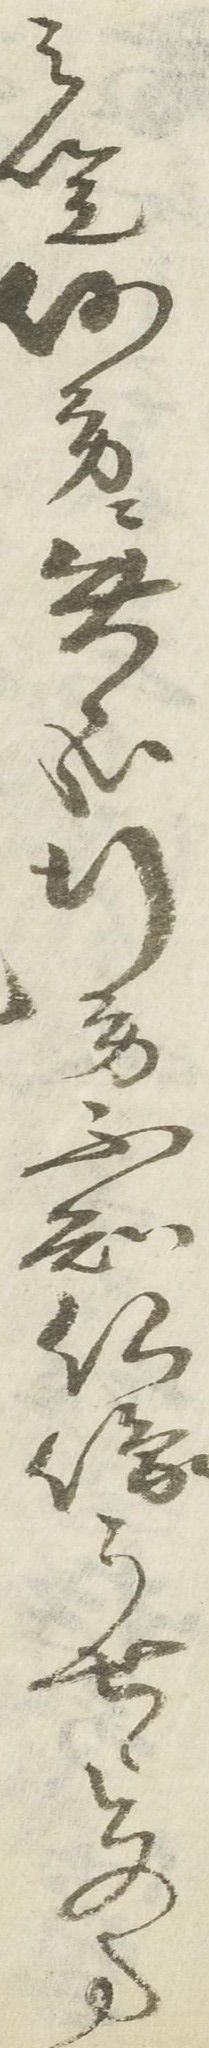之晩何方ニ失候哉行方不知仏像うせしとの事
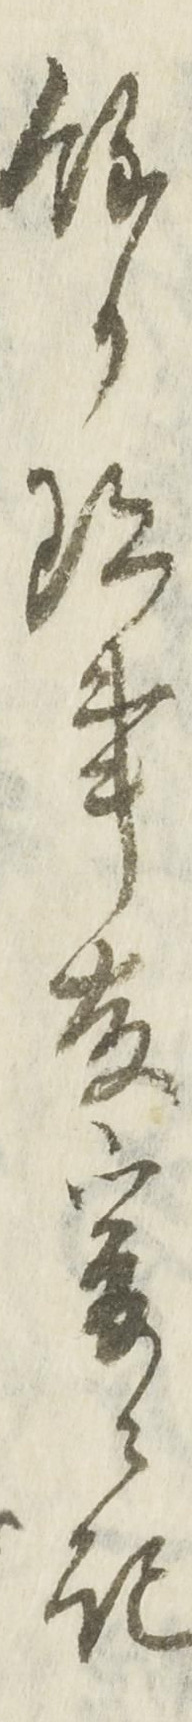餘り珍事故爰ニ記
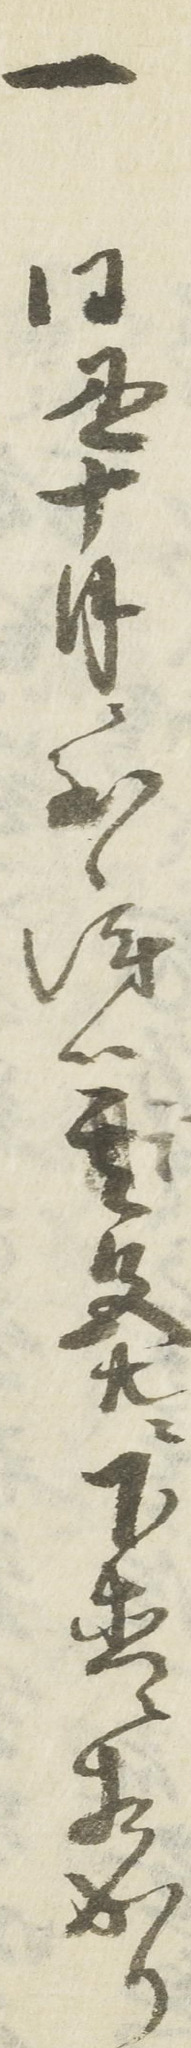一同丑十月ニ至候得は諸色共ニ下直ニ相成り
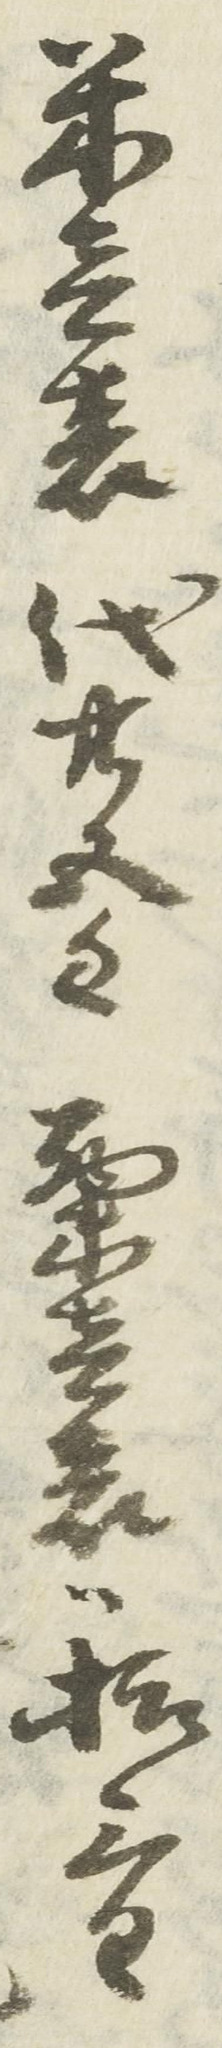米壱表代廿五匁粟壱表は拾三匁
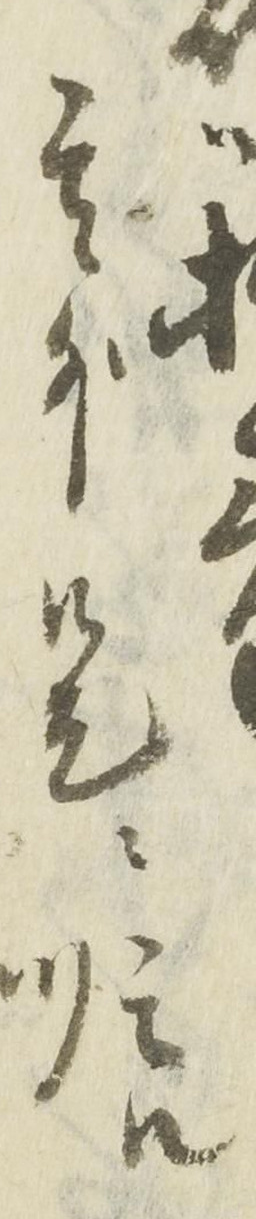其外是ニ順ル
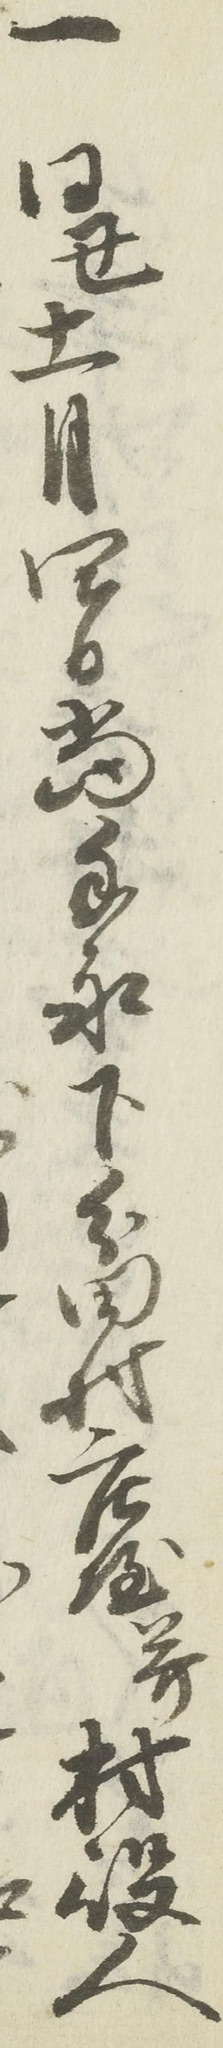一同丑十一月四日当手永下分田村庄屋并村役人
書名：後見笑
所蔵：東京大学地震研究所図書室 Earthquake Research Institute Library, The University of Tokyo, JAPAN
